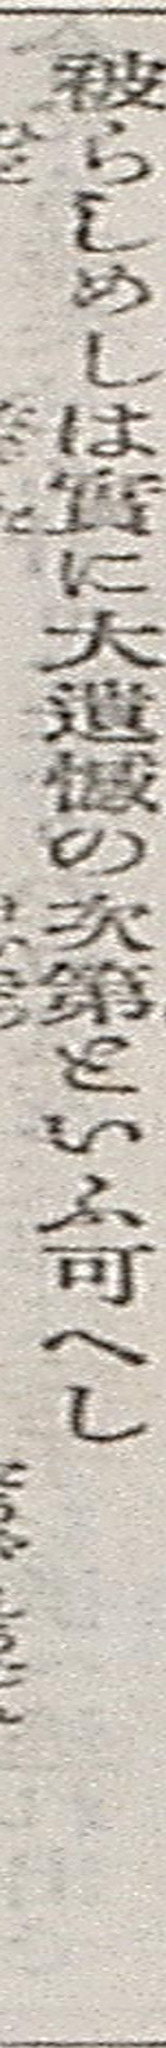被らしめしは実に大遺憾の次第といふ可へし
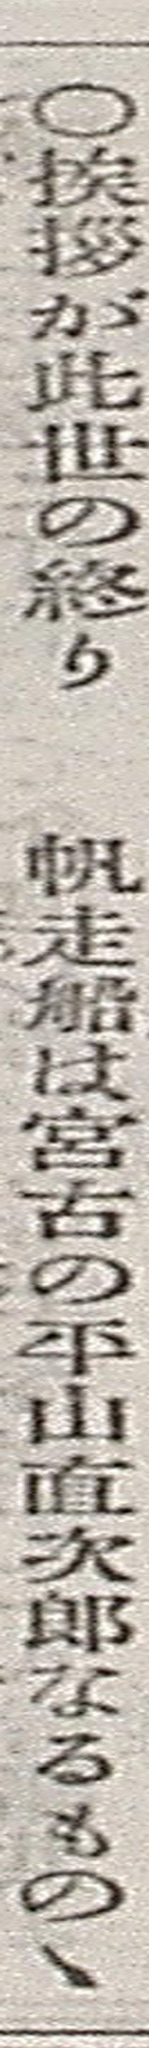○挨拶が此世の終り帆前船は宮古の平山直次郎なるものゝ
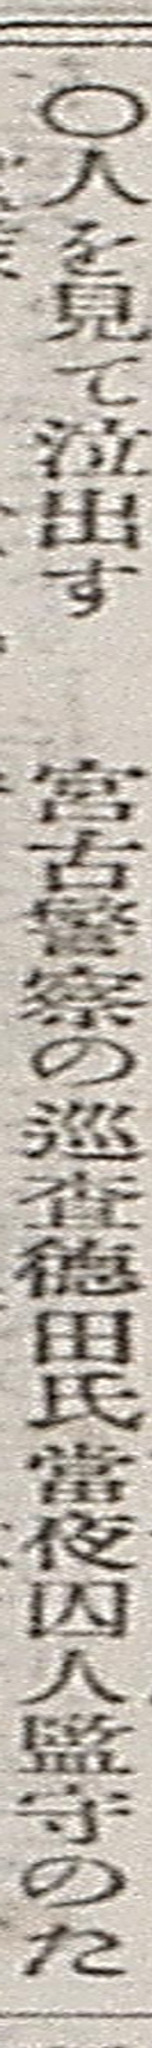○人を見て泣出す宮古警察の巡査徳田氏当夜囚人監守のた
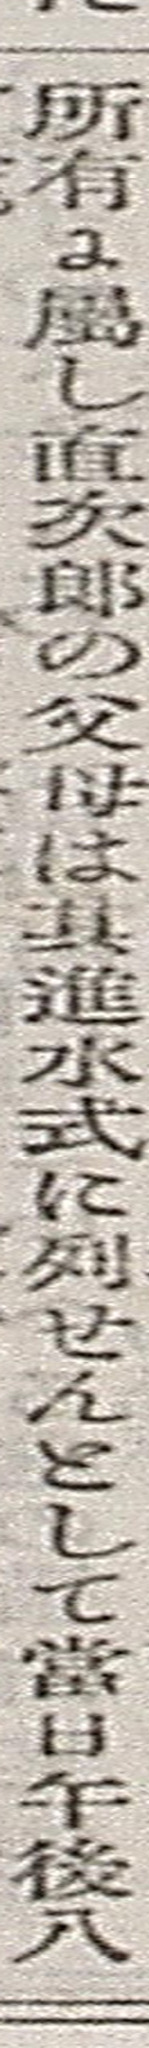所有に属し直次郎の父母は其進水式に列せんとして当日午後八
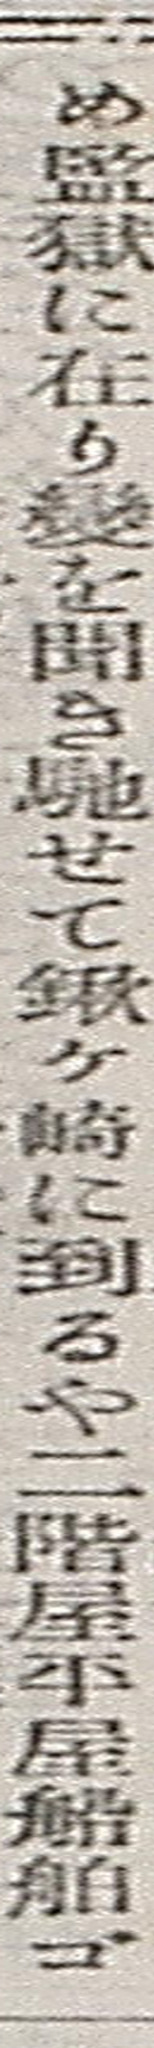め監獄に在り変を聞き馳せて鍬ヶ崎に到るや二階屋平屋船舶ゴ
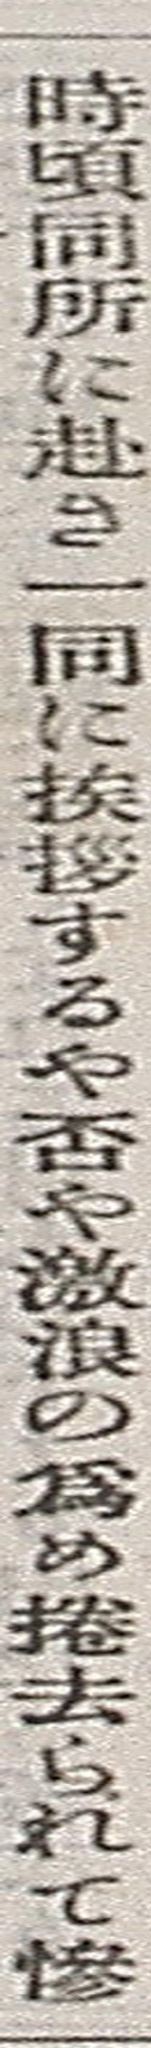時頃同所に赴き一同に挨拶するや否や激浪の為め捲去られて惨
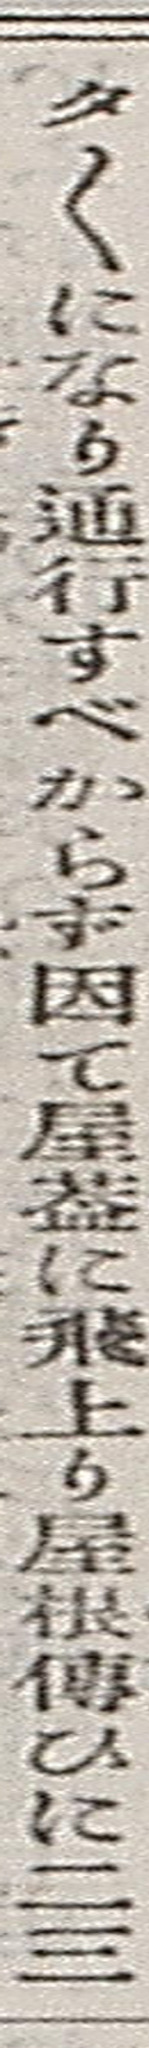タ〳〵になり通行すべからず因で屋蓋に飛上り屋根伝ひに二三
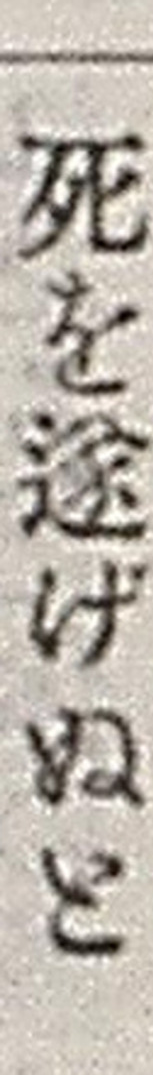死を遂げぬと
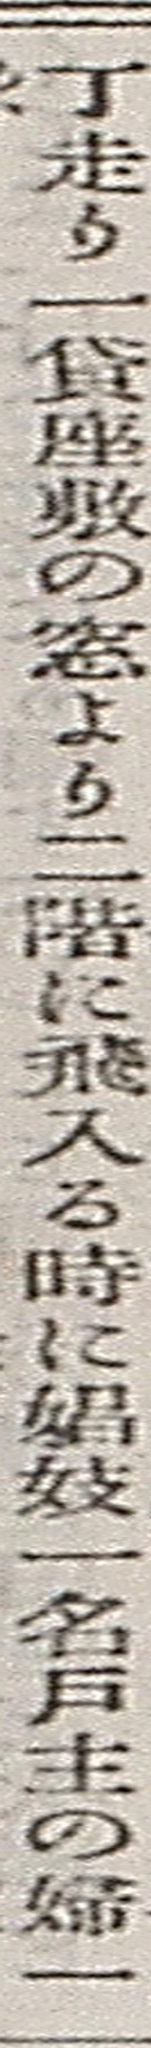丁走り一貸座敷の窓より二階に飛入る時に娼妓一名戸主の婦一
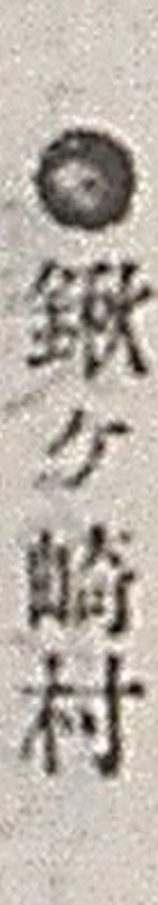●鍬ヶ崎村
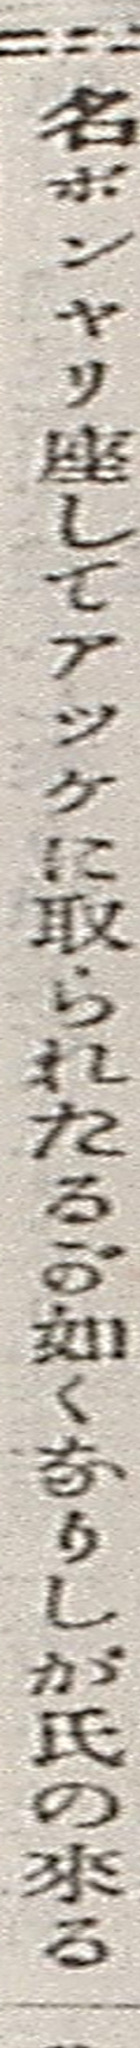名ボンヤリ座してアツケに取られたるが如くなりしが氏の来る
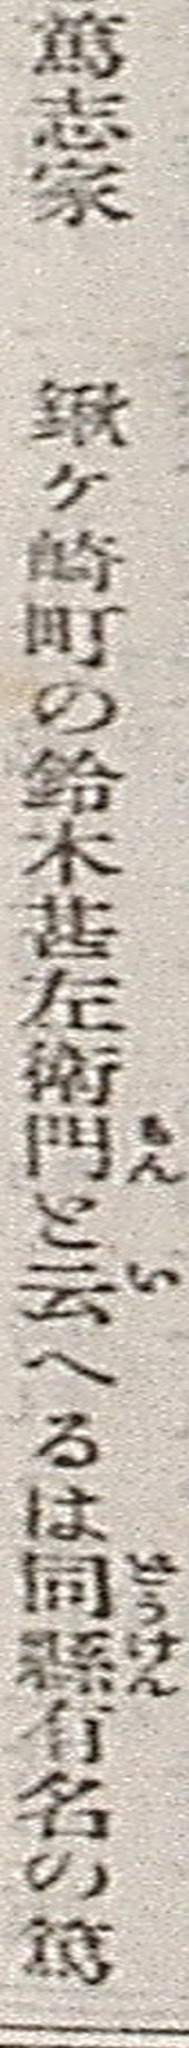○篤志家鍬ヶ崎町の鈴木甚左衛門と云へるは同県有名の篤

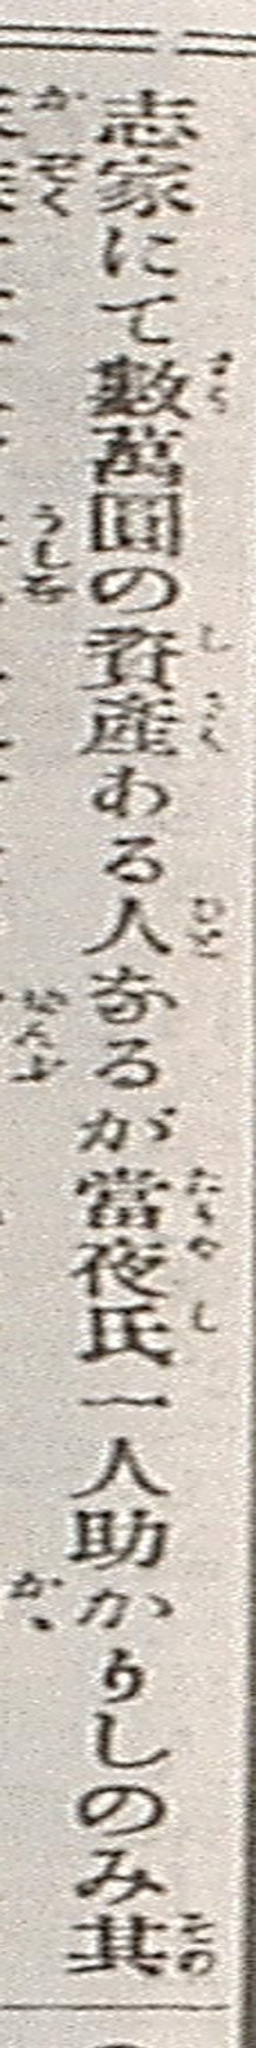志家にて数万円の資産ある人なるが当夜氏一人助かりしのみ其
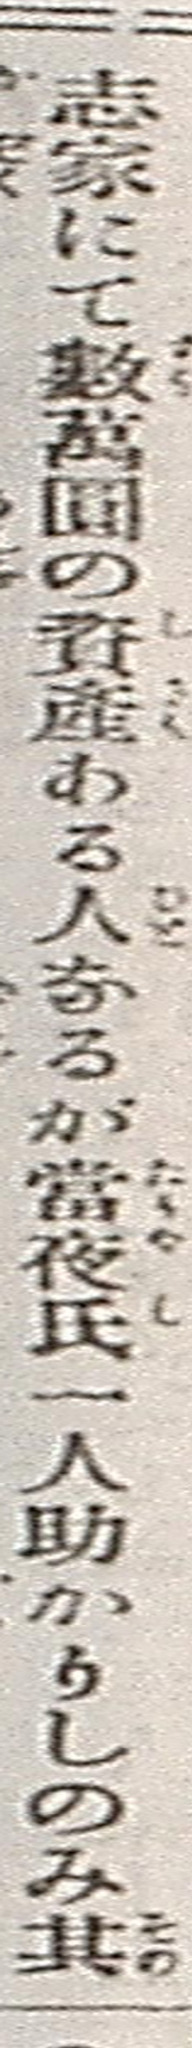志家にて数万円の資産ある人なるが当夜氏一人助かりしのみ其
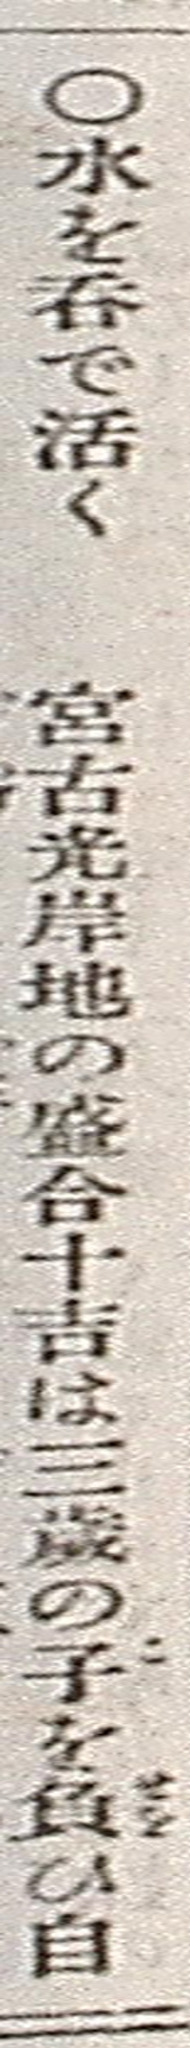○水を呑で活く宮古光岸地の盛合十吉は三歳の子を負ひ自
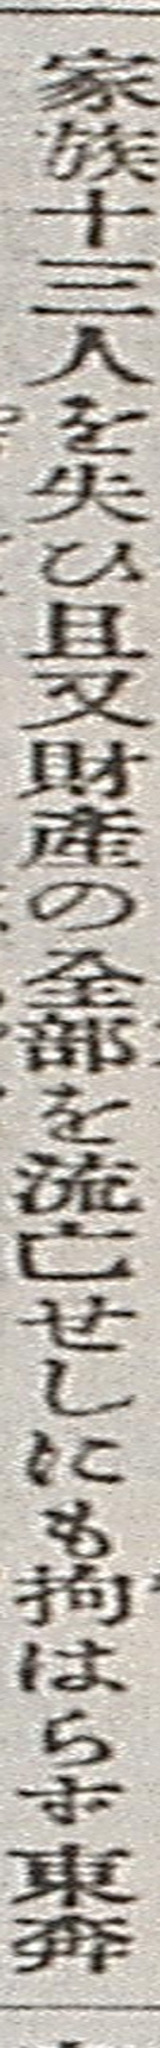家族十三人を失ひ且又財産の全部を流亡せしにも拘はらず東奔
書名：風俗畫報臨時増刊第百二十號　大海嘯被害録（下）
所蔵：東京大学地震研究所図書室 Earthquake Research Institute Library, The University of Tokyo, JAPAN
